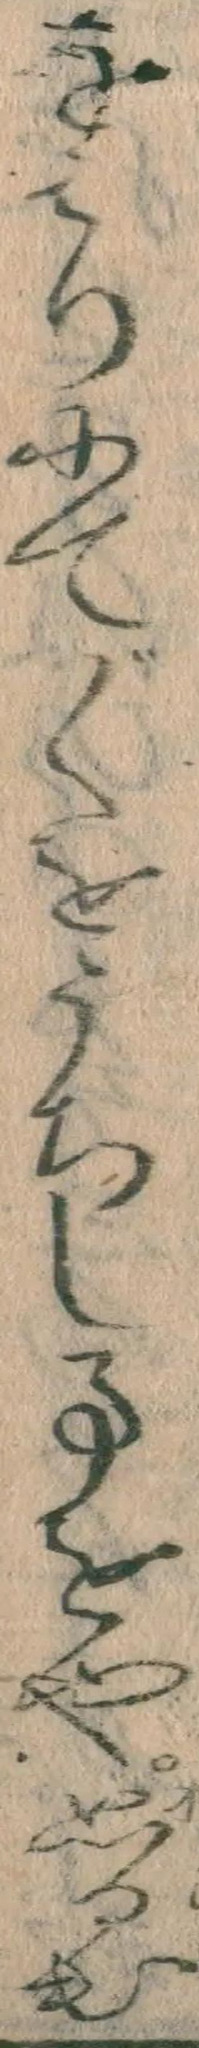をはりにてぐをうちし事をや。思ひ出
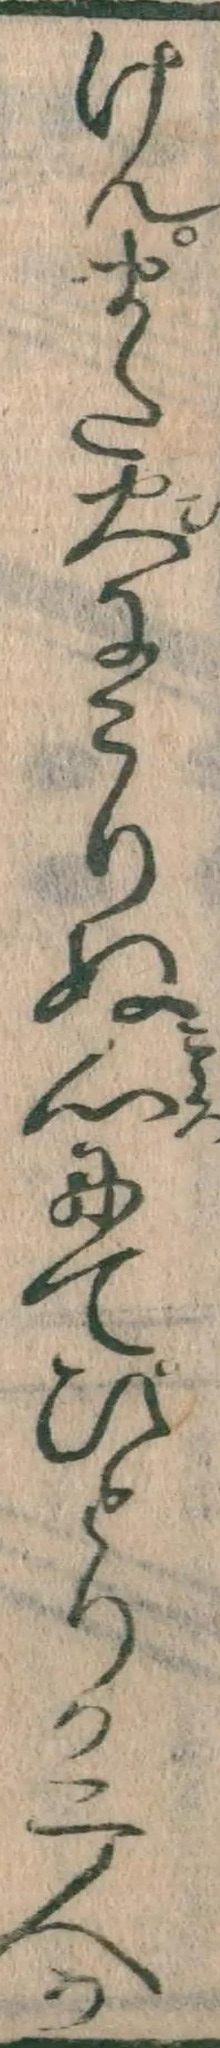けん。また火にこりぬ心にて。ひとりか二人か
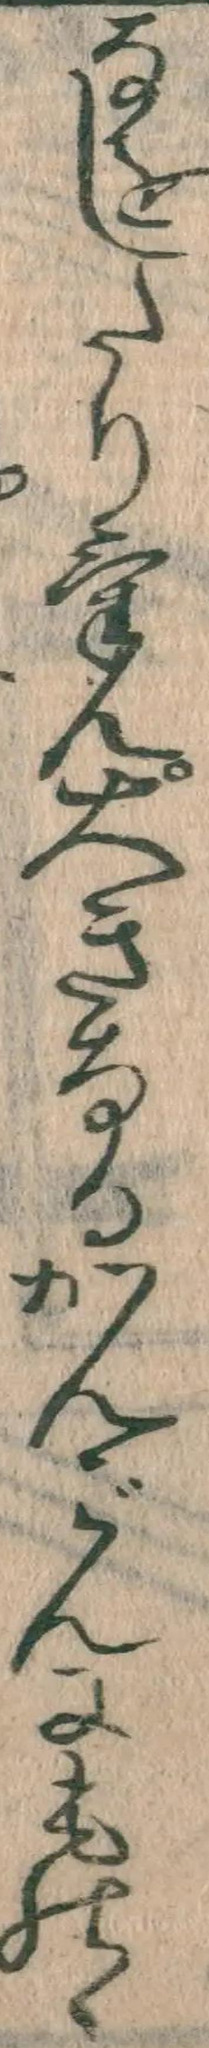なをしたりけん。大きなるかんばんにものゝ
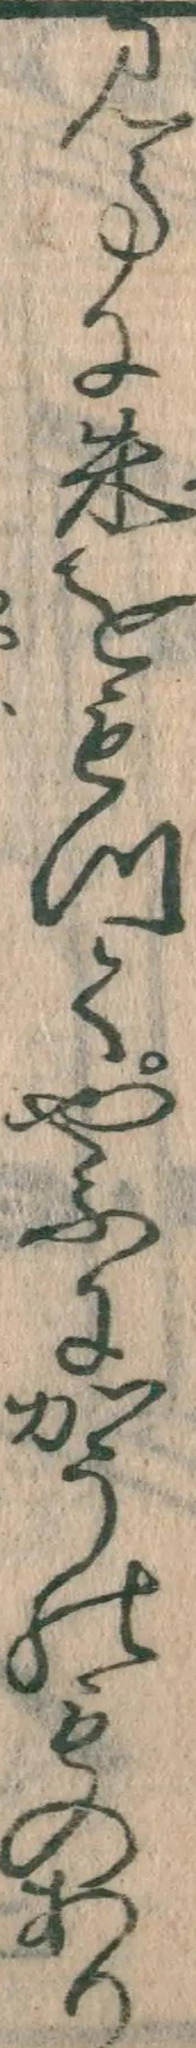見事に朱をもつて。やふにかうのものあり
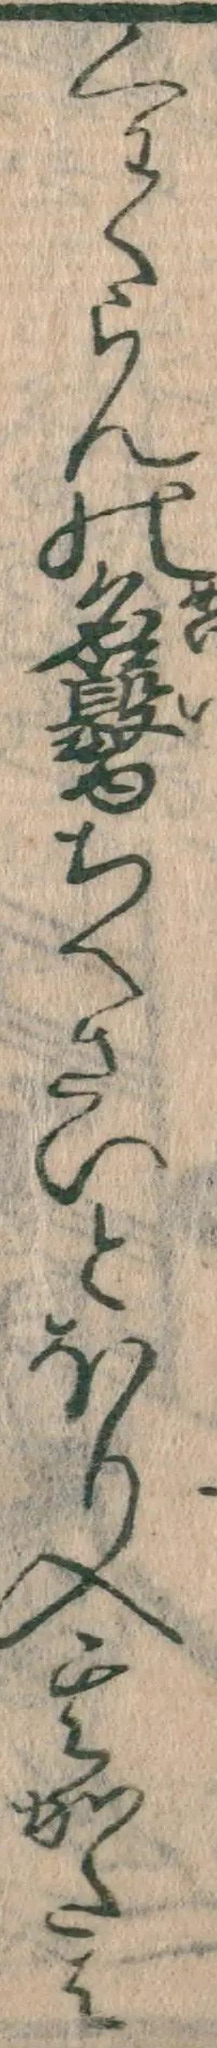くわくらんの名医ちくさいとほり入其かたは
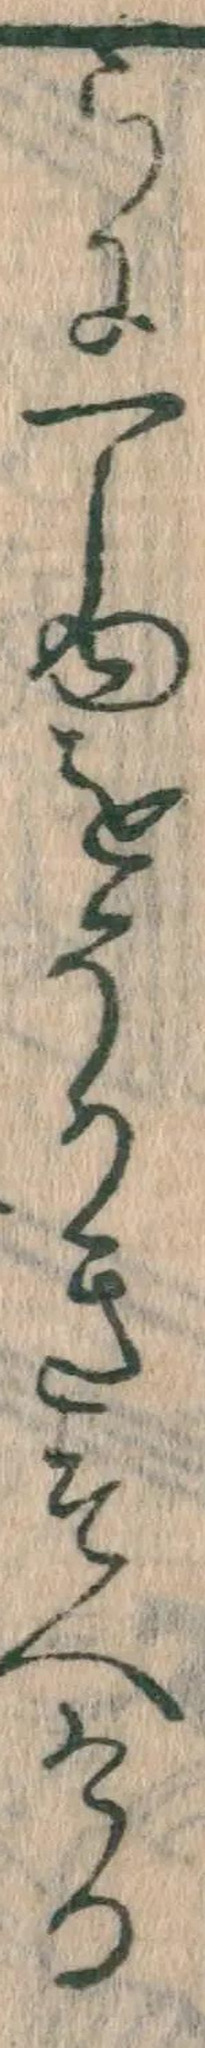らに一しゆをそかきそへける
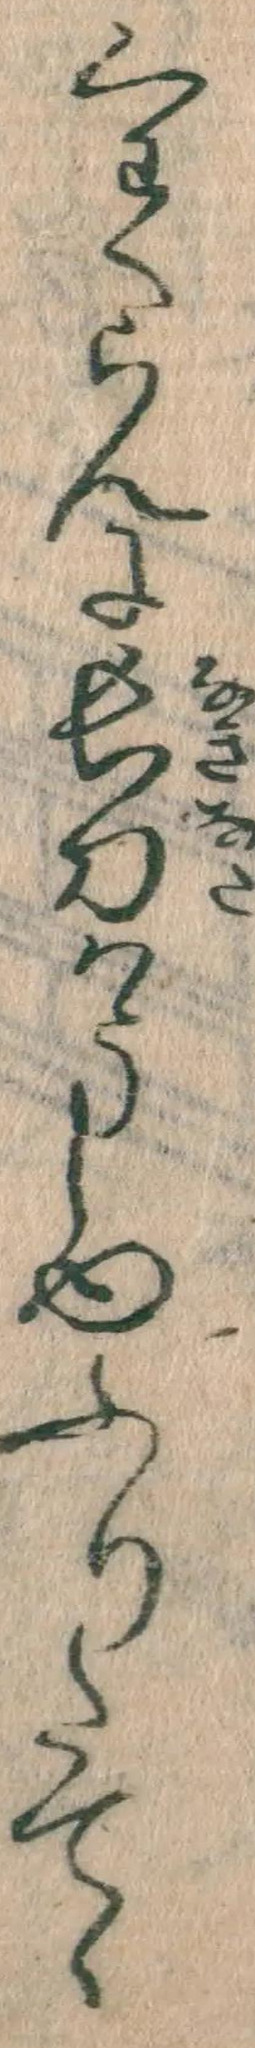くわくらんに長刀かうしゆふりたてゝ
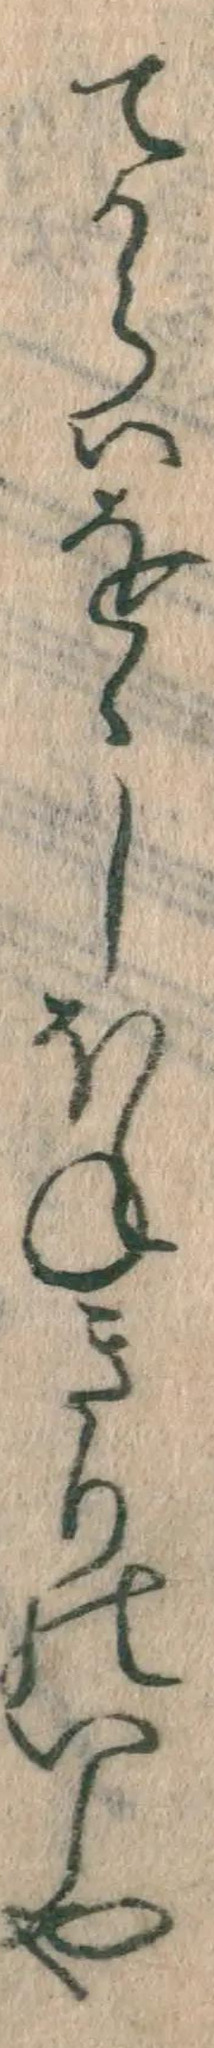てからはをゝしほねきりのいしや
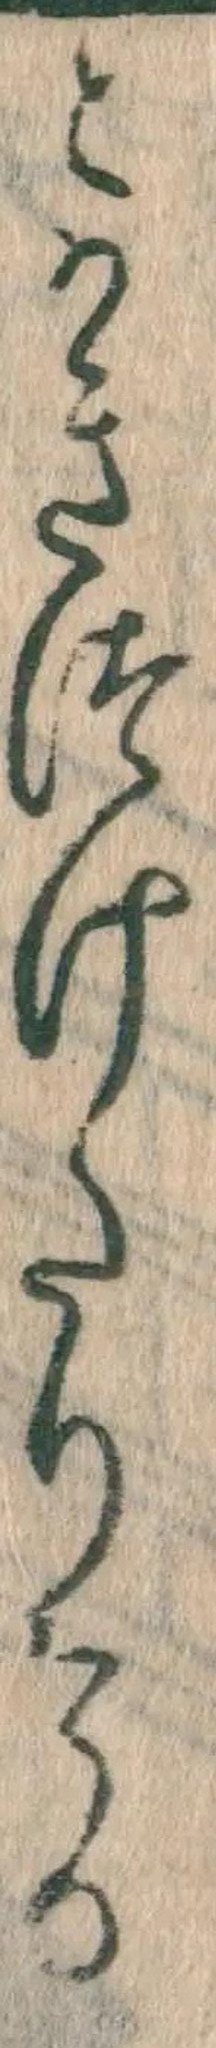とかきつけたりける

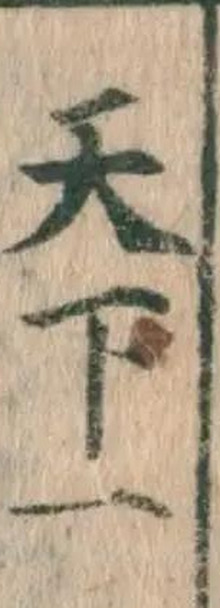天下一
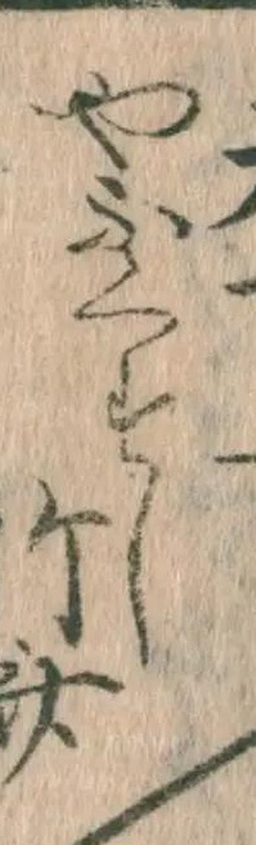やふくすし
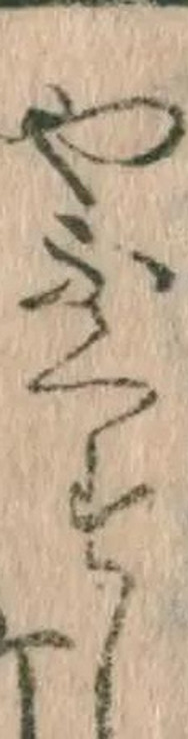やふくすし
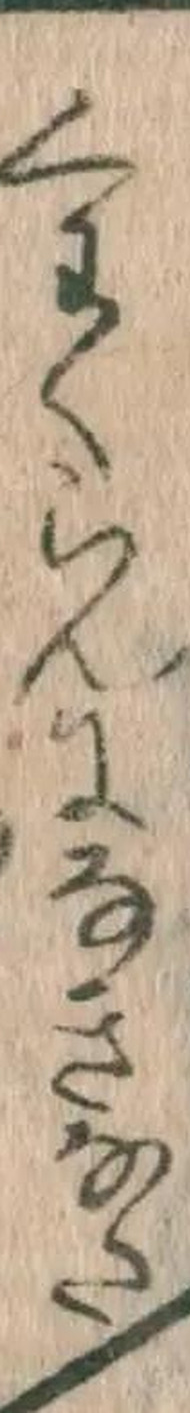くわくらんになきなた
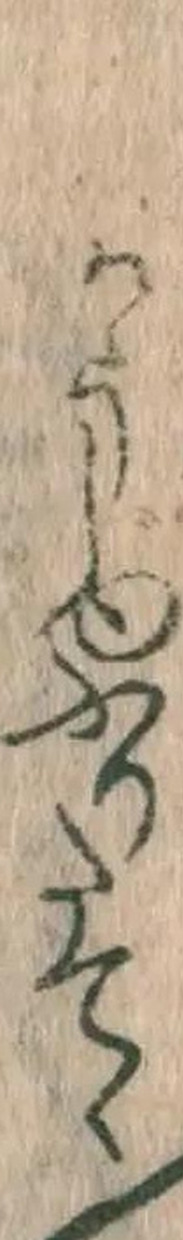かうしゆふりたてゝ
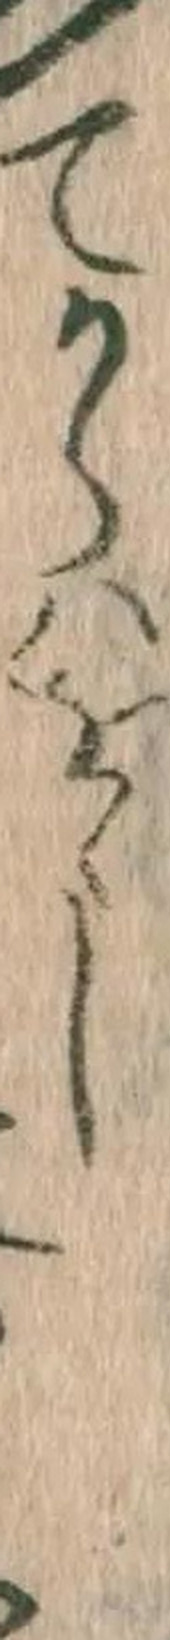たからはをゝし
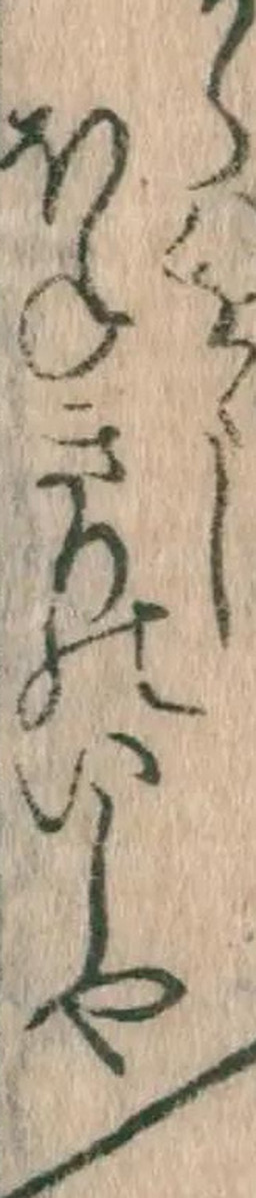ほねきりのいしや
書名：竹斎狂歌物語 3巻
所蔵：国立国会図書館 National Diet Library, JAPAN
